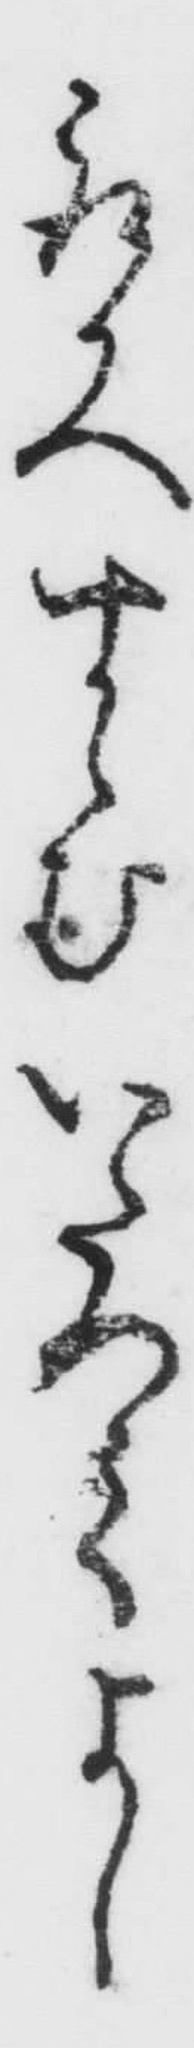取かへすゝむいたつてよし
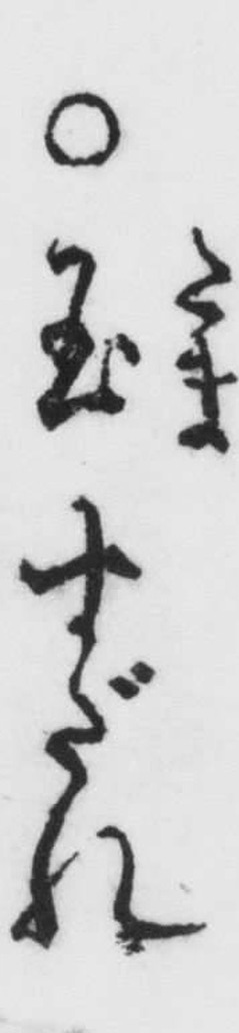○玉すだれ

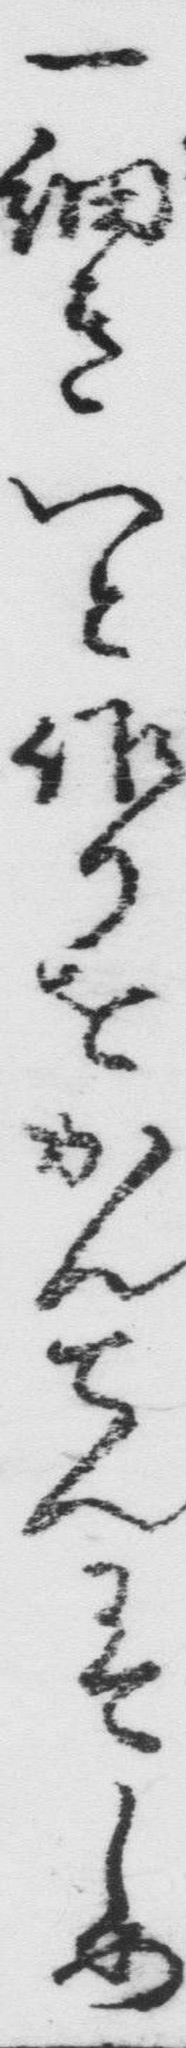一細きいと作りをかんてんにてしめ
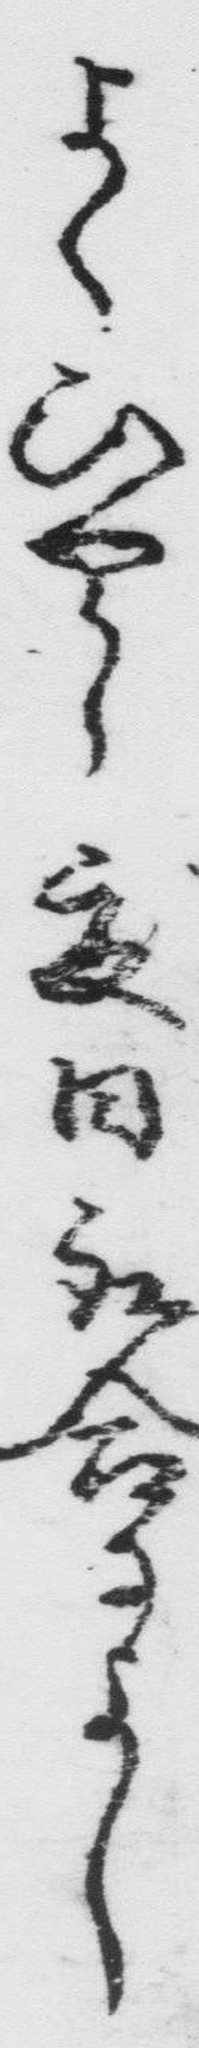よくひやし夏日取合によし
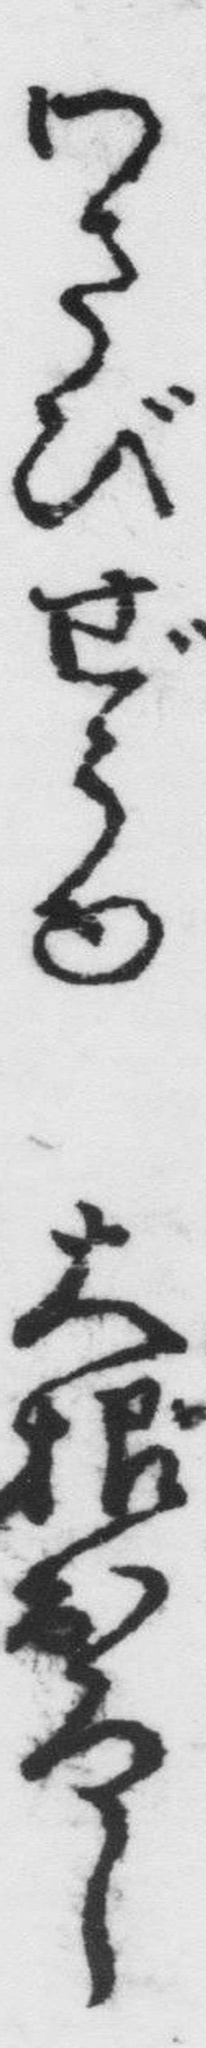わさびぜうゆ大根おろし
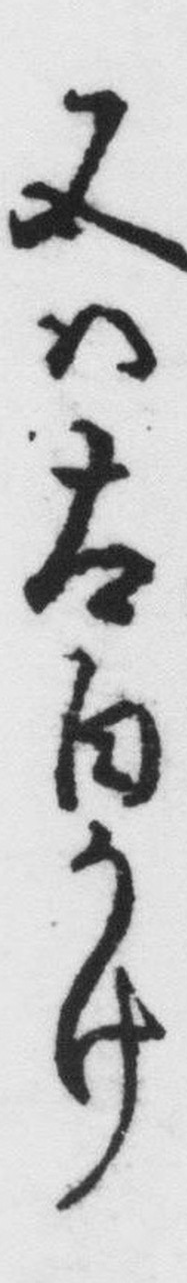又は大白かけ
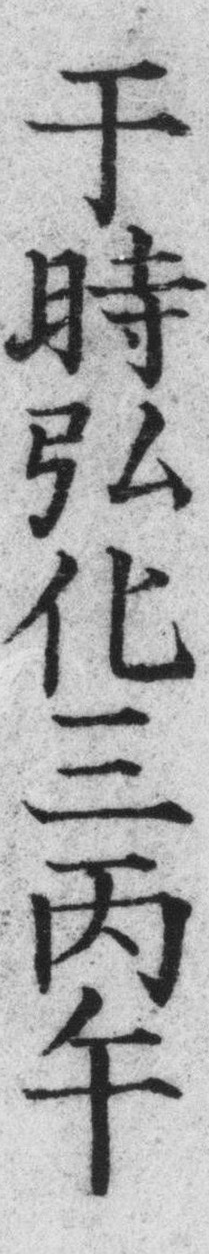于時弘化三丙午
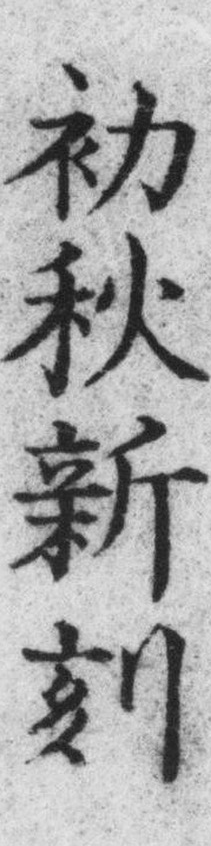初秋新刻
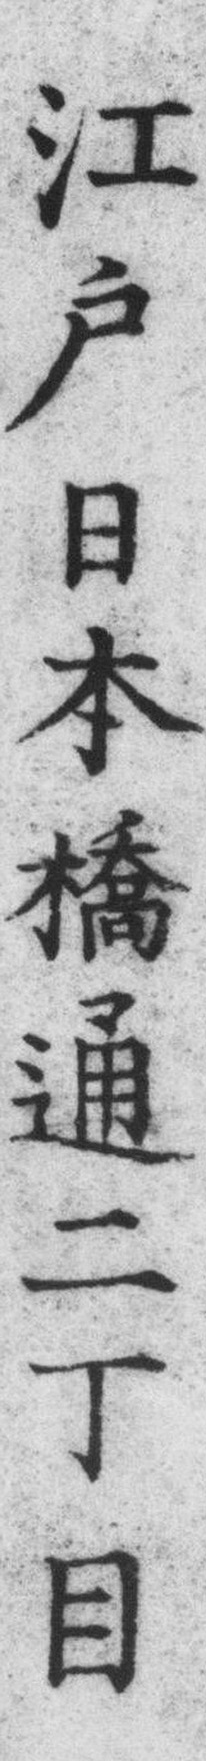江戸日本橋通二丁目
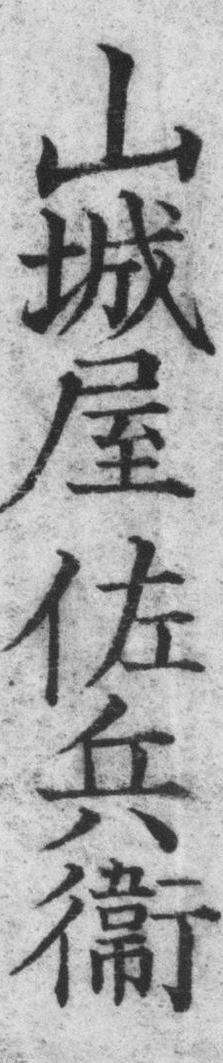山城屋佐兵衛
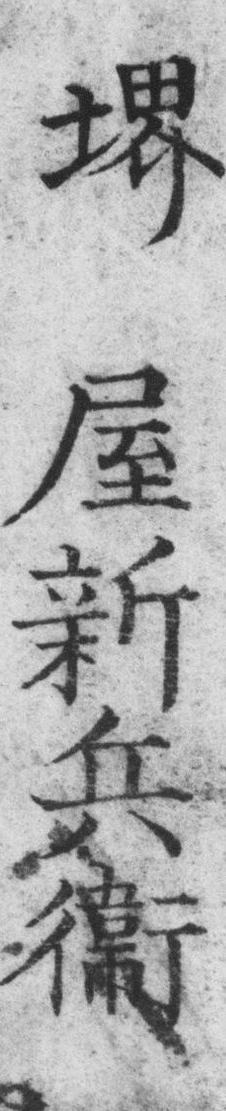堺屋新兵衛
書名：蒟蒻百珍
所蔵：大阪府立大学学術情報センター 国文学研究資料館
